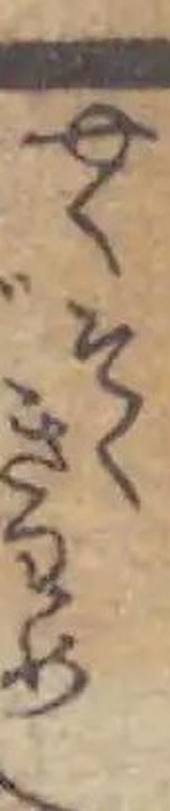やくそくきわめ
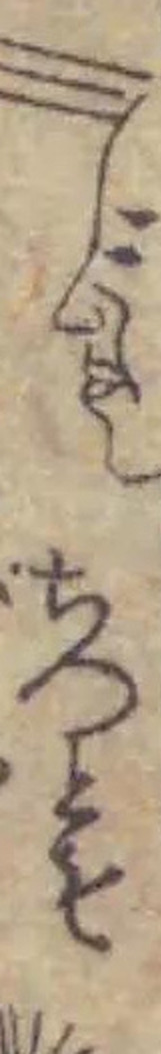ちつとも
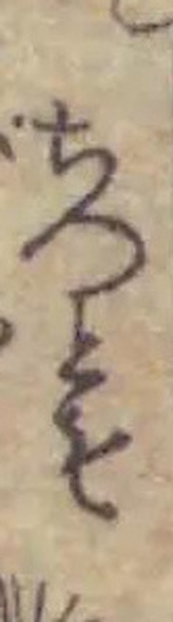ちつとも
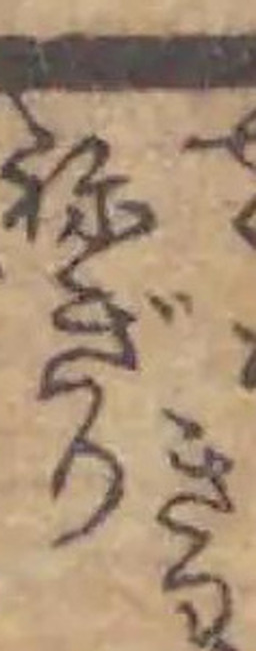ねぎり
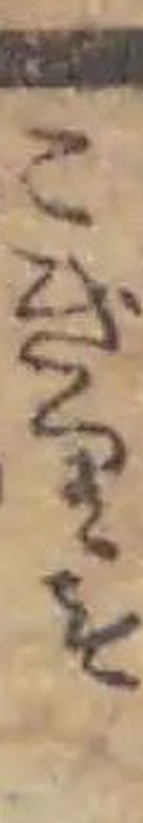こぎりも
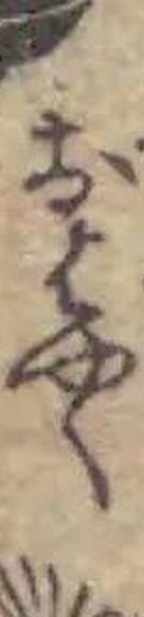おはやく
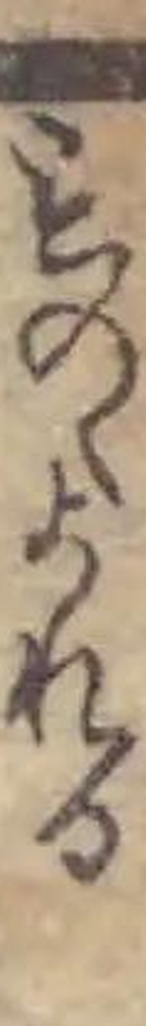ものゝよれる
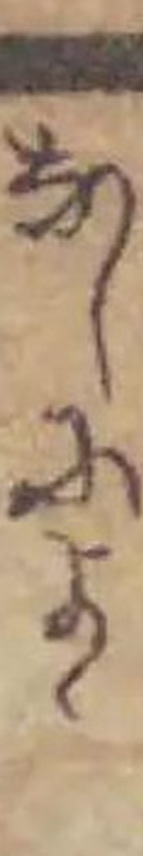なしによく
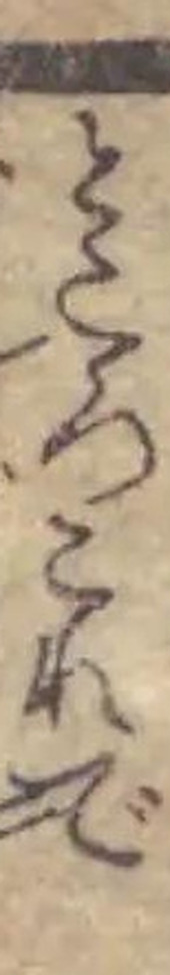ところこれで
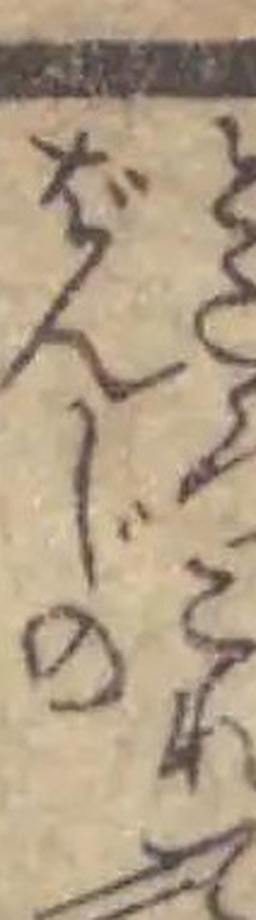ばんじの
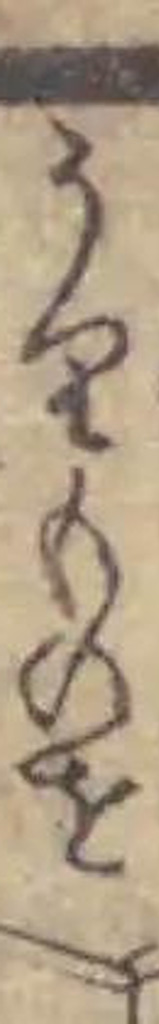うりものを

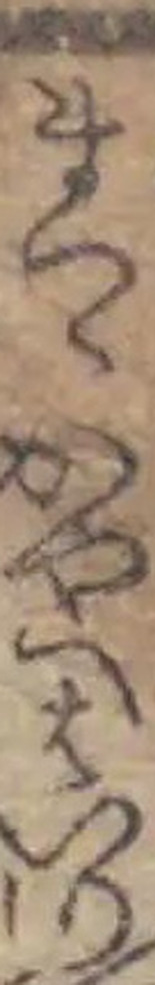まへゝかやへはいり
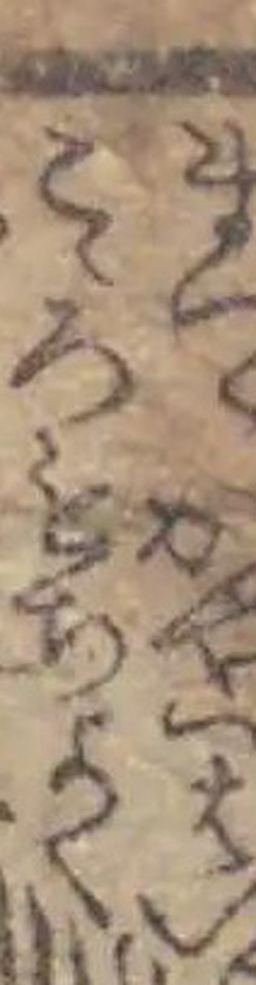こゝろもちよく
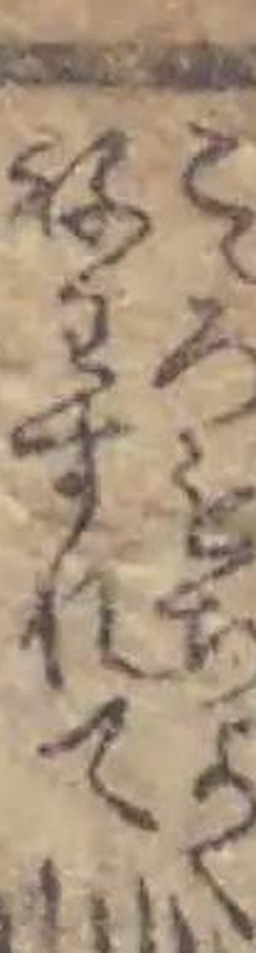ねわすれて
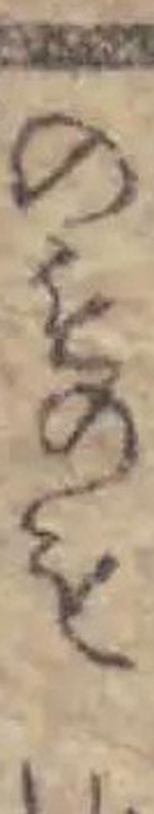のものも
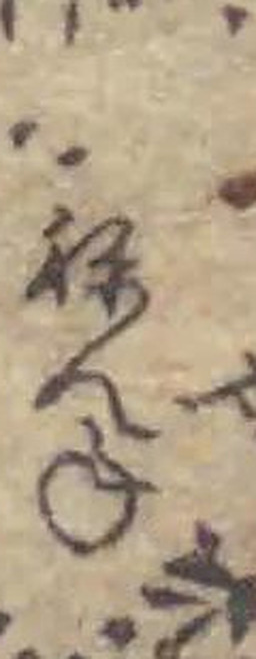ねんね
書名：豆男江戸見物 2巻
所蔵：国立国会図書館 National Diet Library, JAPAN
